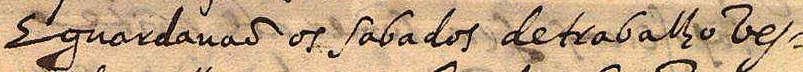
E guardauaõ os sabados de trabalho ves
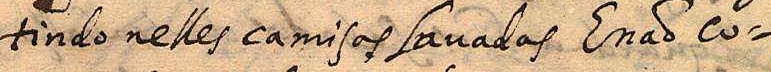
tindo nelles camisas Lauadas E naõ co
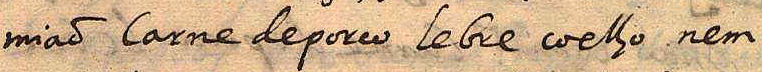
miaõ Carne de porco lebre coelho nem
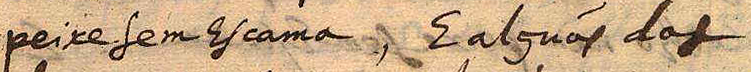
peixe sem Escama, E alguas̄ das
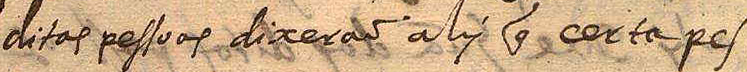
ditas pessoas dizeraõ aly q̄ certa pes
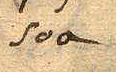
soa
